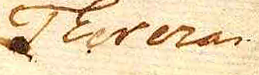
Thereza
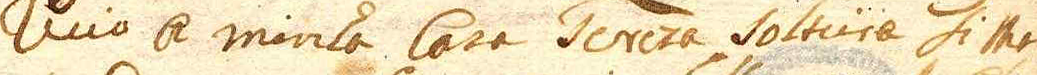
veio a minha Caza Tereza solteira filha
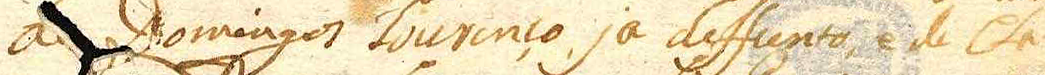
d_ Domingos Lourenço, ja deffunto, e de Cla
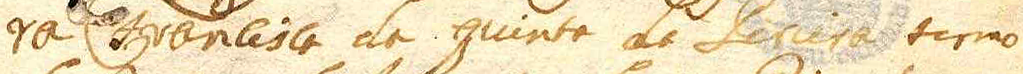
ra Francisca da quinta da Pereira termo
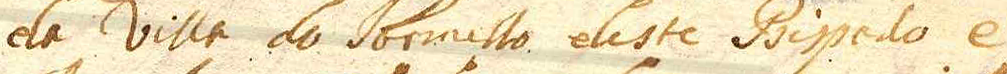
da Villa do Iarmello deste Bispado e
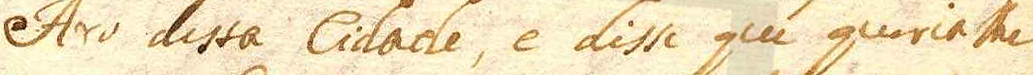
Aro desta Cidade, e disse que queria lhe
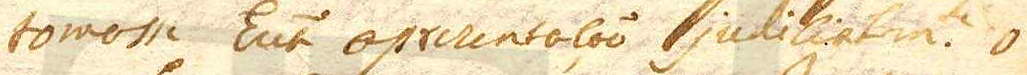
tomasse huā aprezentaçaõ judicialm.te o
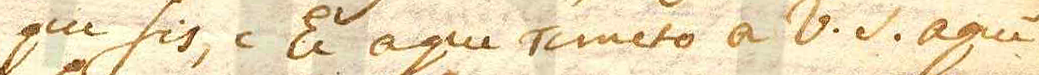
que fis, e he a que remeto a V. S. a quē
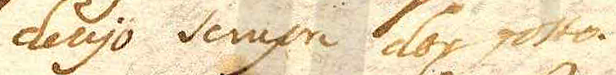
dezejo sempre dar gosto.
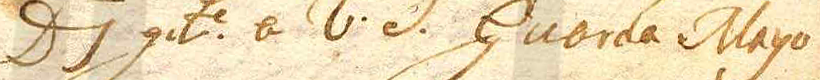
Ds̄ gde. a V. S. Guarda Mayo
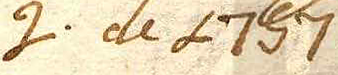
2. de 1757.
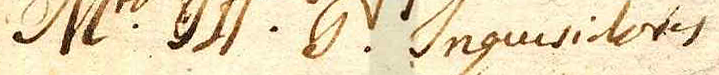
M.to Il̄l.es s.rs Inquisidores
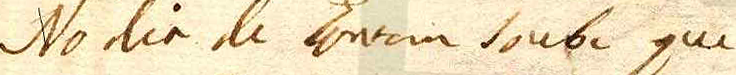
No dia de hontem soube que
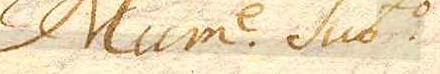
Hum.e Subo.
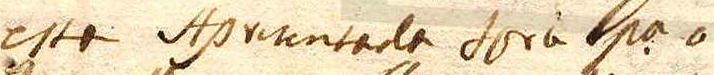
esta Aprezentada fora p.a o
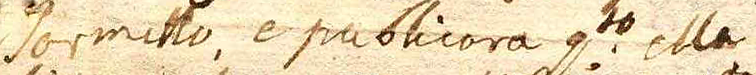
Jarmello, e publicara q.to ella
